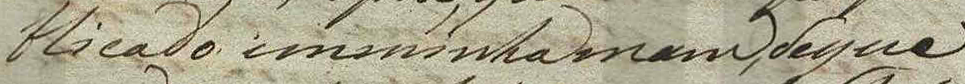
blicado em minha mam, de que
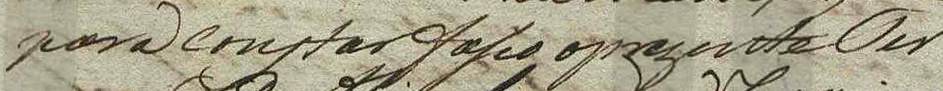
para constar fasso o prezente Ter
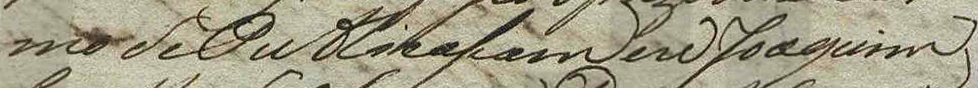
mo de Publicassam eu Joaquim
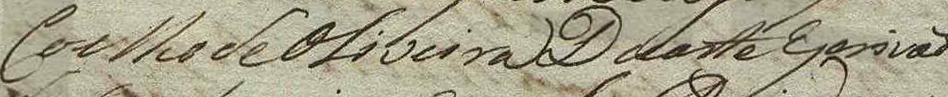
Coelho de oLiveira Duarte Escrivaõ
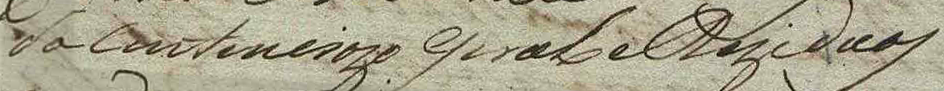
do contenciozo Geral e Reziduos
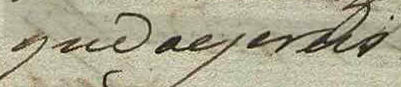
que o escrevi
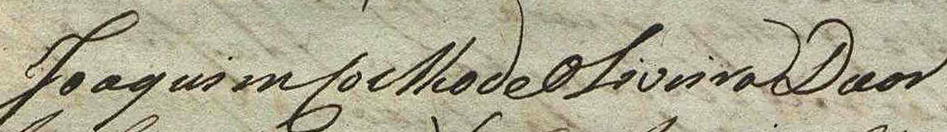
Joaquim Coelho de Oliveira Duar
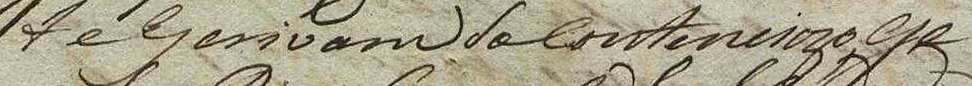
te Escrivam do contenciozo Ge
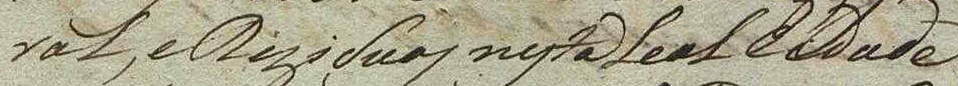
ral, e Reziduos nesta Leal cidade
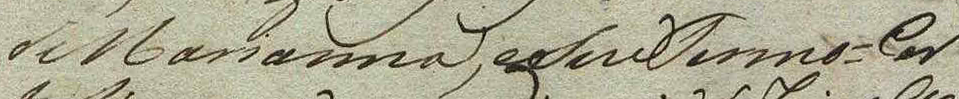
de Marianna, e Seu Termo= Cer
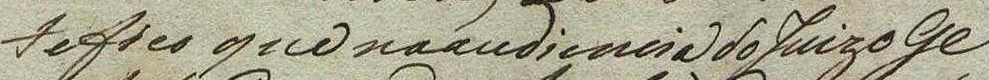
tefico que na audiencia do Juizo Ge
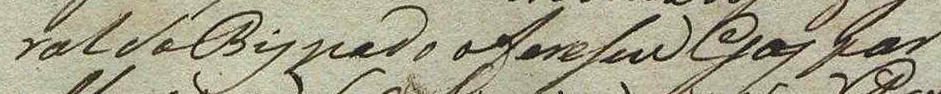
ral do Bispado ofereseu Gaspar
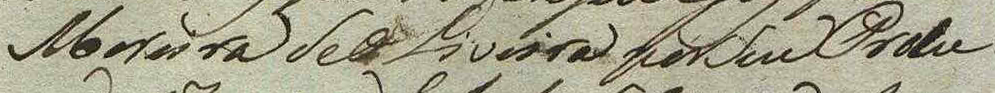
Moreira de oLiveira por seu Procu
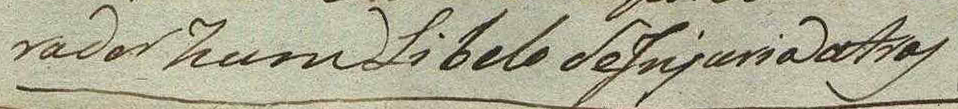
rador hum Libelo de Jnjuria atras
